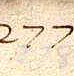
277
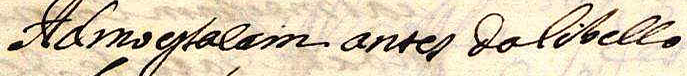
Admoestaçam antes do libello
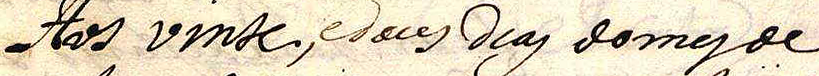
Aos vinte, e dous dias do mes de
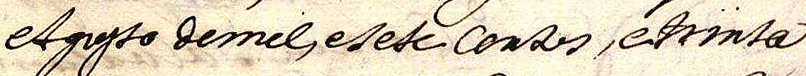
Agosto de mil, e setecentos, e trinta
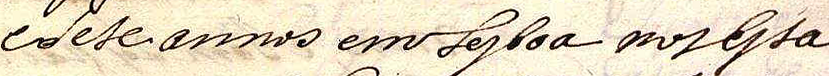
e sete annos em Lisboa nos Esta
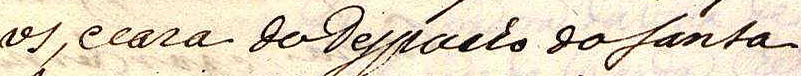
os, e caza do Despacho da santa
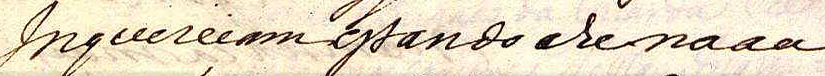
Jnquiziçam estando ahi na au
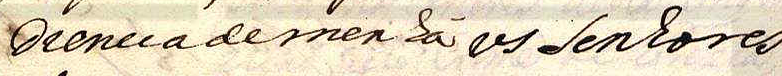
diencia de menhã os senhores
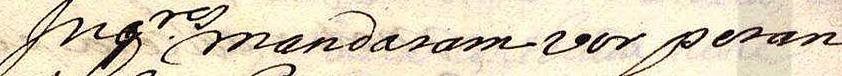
Jnq.res mandaram vir peran
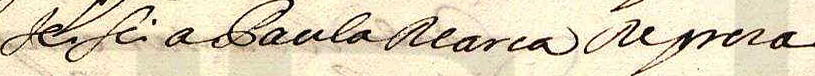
te si a Paula Maria Re preza
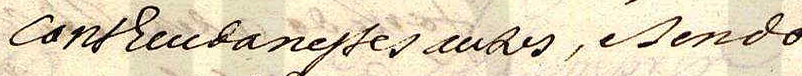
contheuda nestes autos, e sendo
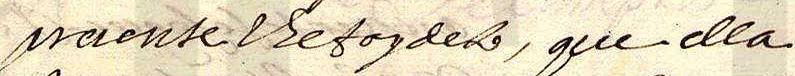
prezente lhe foy dito, que ella
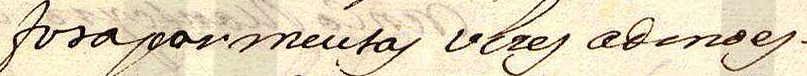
fora por muitas vezes admoes
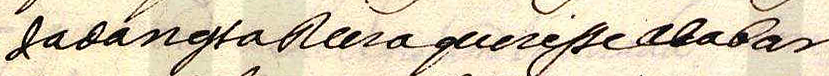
tada nesta Meza quizessse aCabar
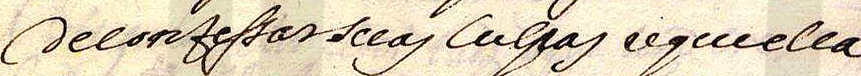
de confessar suas Culpas o que ella
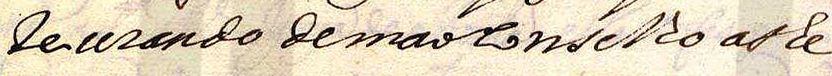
Re uzando de mao Conselho athe
